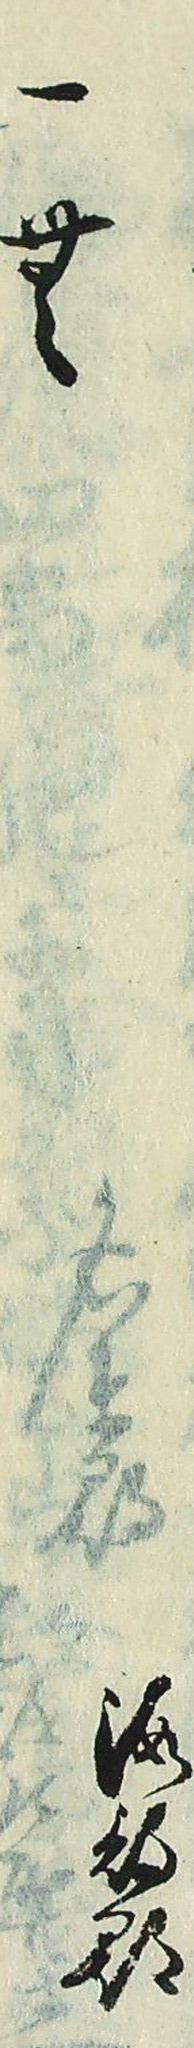一無海部郡
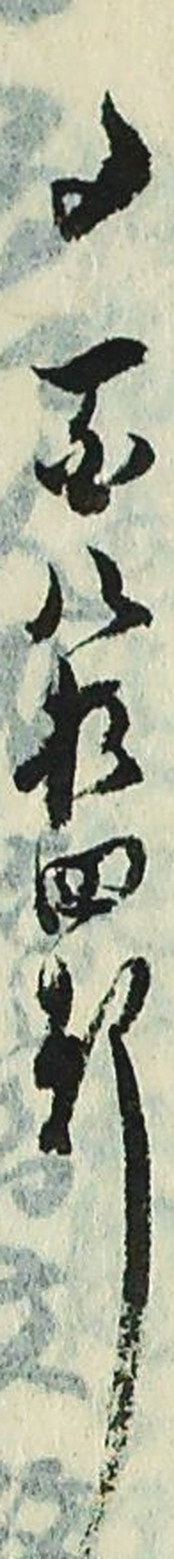〆百八拾四軒
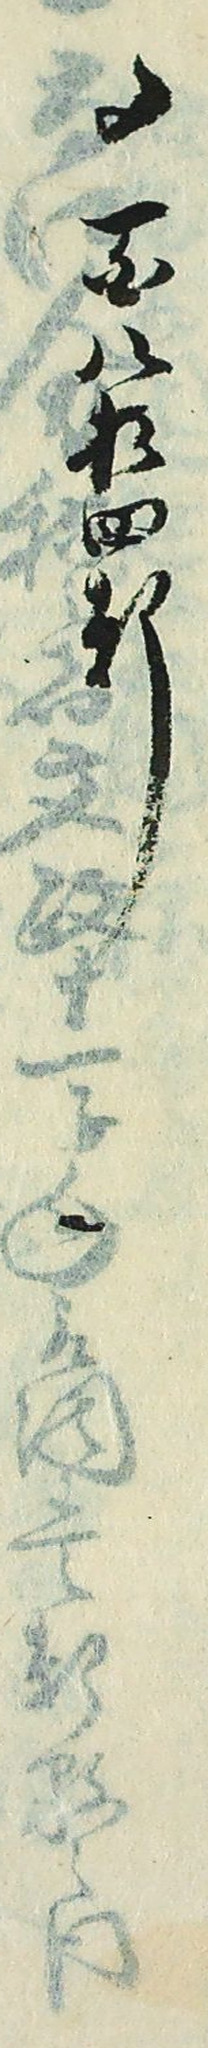〆百八拾四軒
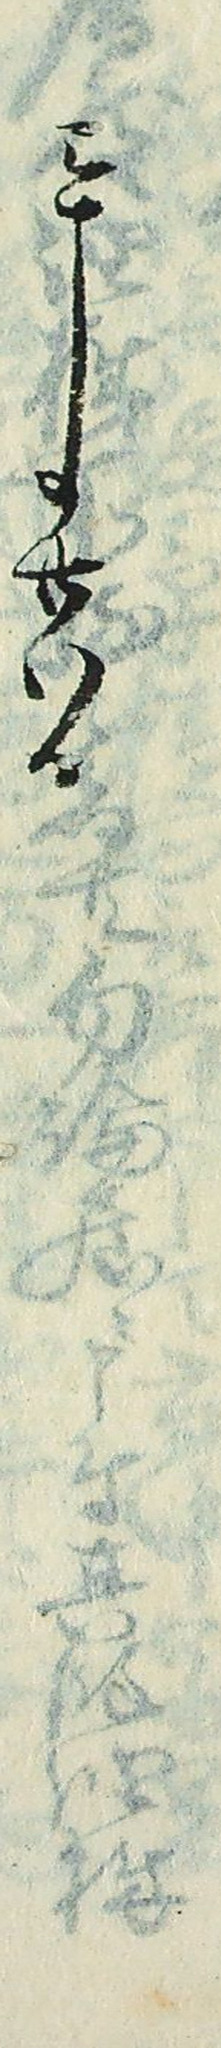巳十月廿八日
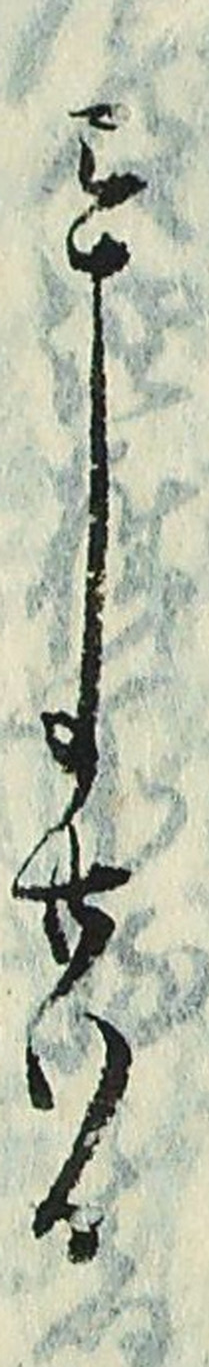巳十月廿八日

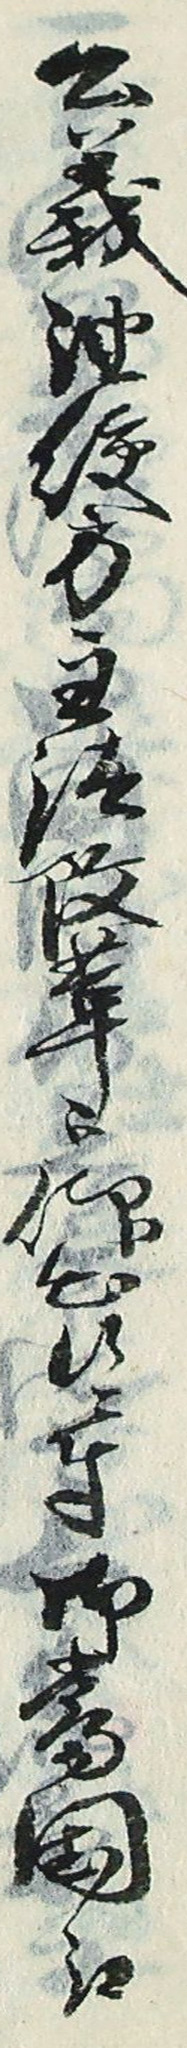公儀油絞方主法改革被仰出候に付御当国江
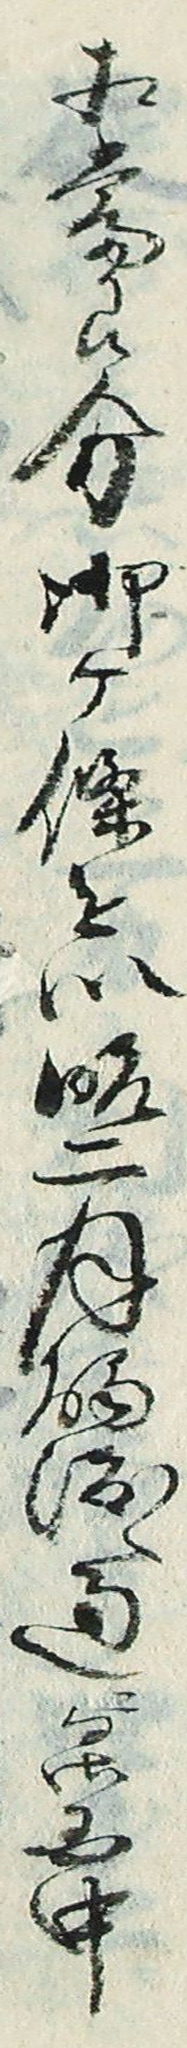相当り候分御ケ條を以昨二月触渡候通に而御国中
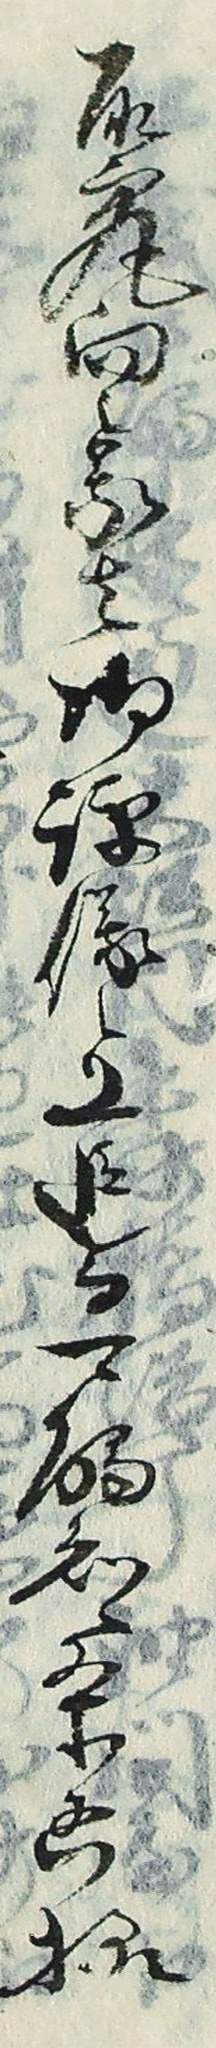取究向之義者御評義之上追而可触知候条右様
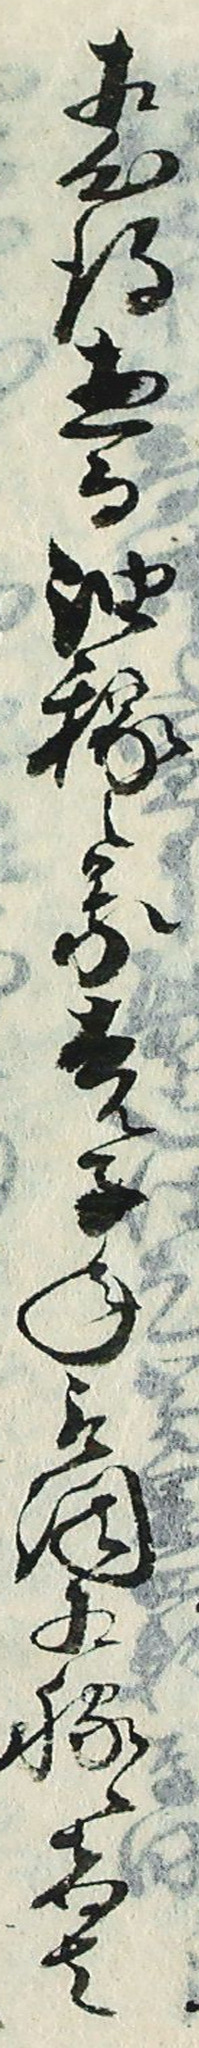相心得惣而油稼之儀去る子年取調相稼候者者
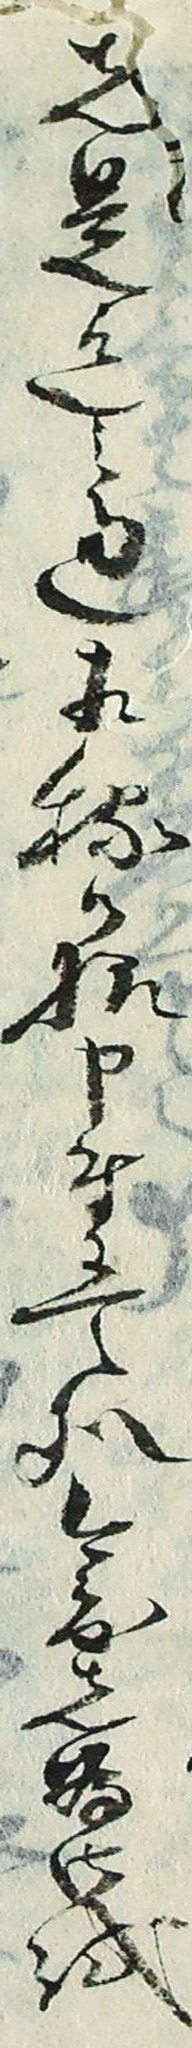先是迄之通相稼候様申付有之処今度先為御試
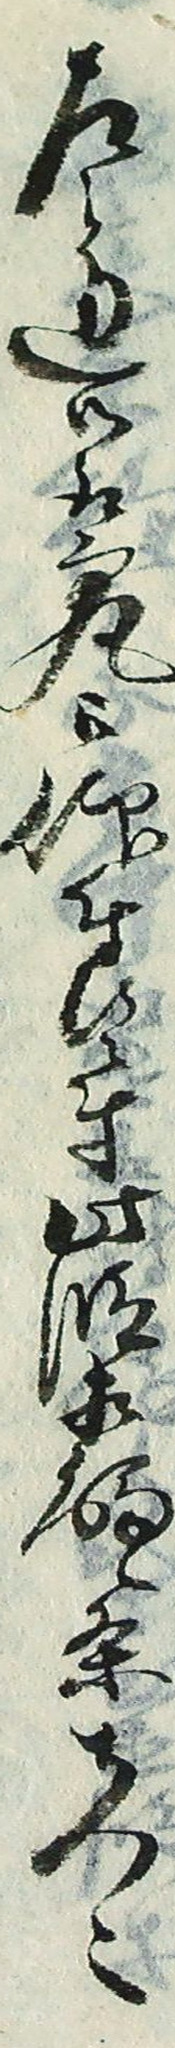左之通御取究被仰付候に付此段相触候条夫々
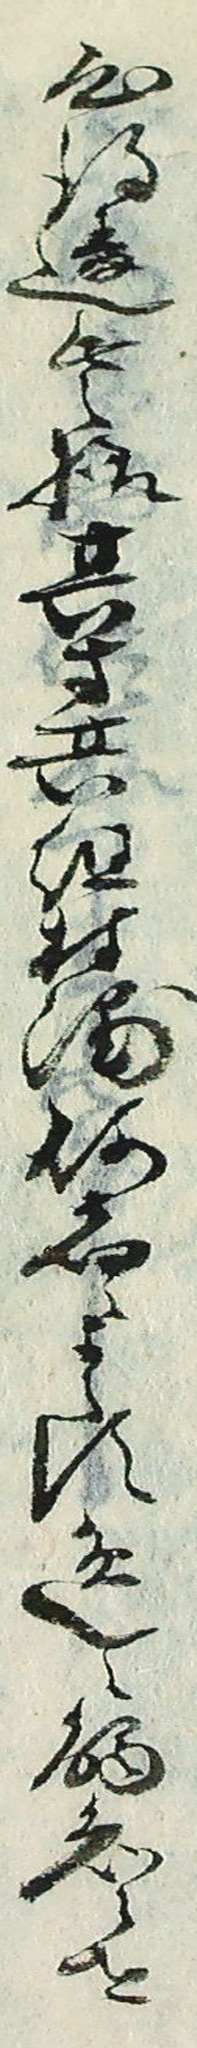心得違無之様其方共組村浦何者によらす逸々触知らせ
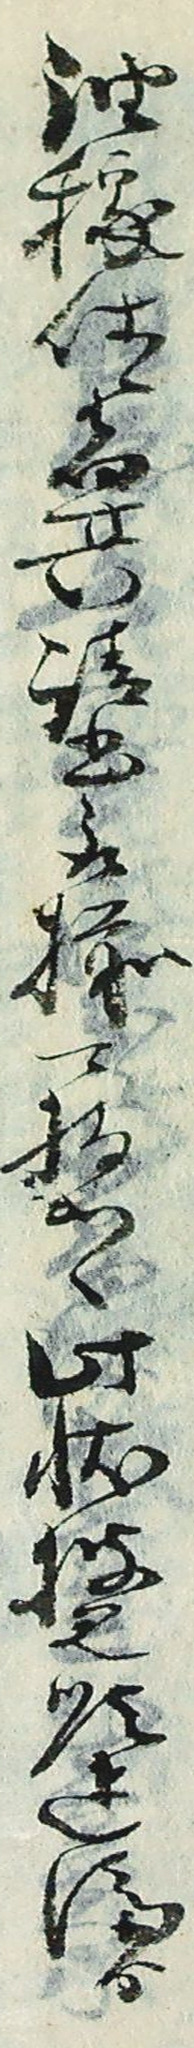油稼仕候者共請書取揃可指出候此状披見順達済ゟ
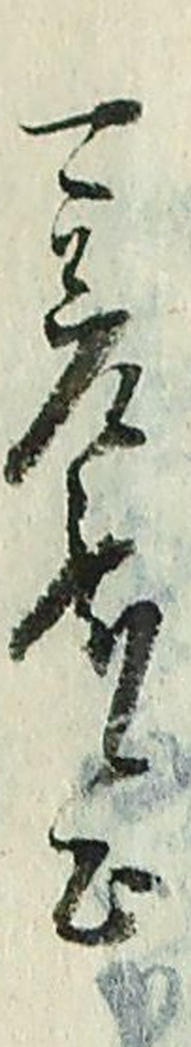可差戻候以上
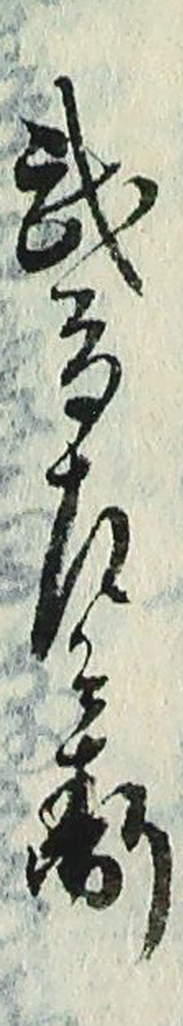武市左兵衛
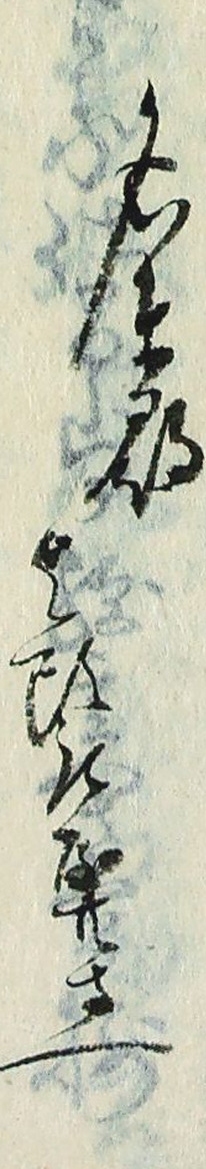名東郡与頭庄屋共方へ
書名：油稼御取究ニ附御箇條書テ以被仰渡南北同役申談御答書控
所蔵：鳴門教育大学 Naruto University of Education
